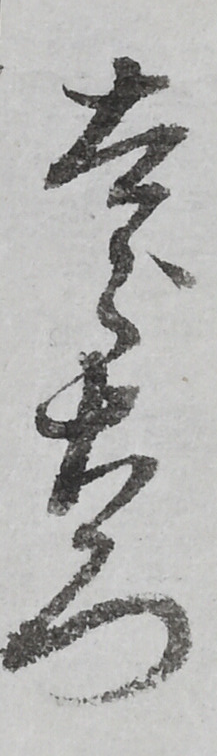同十左衛門
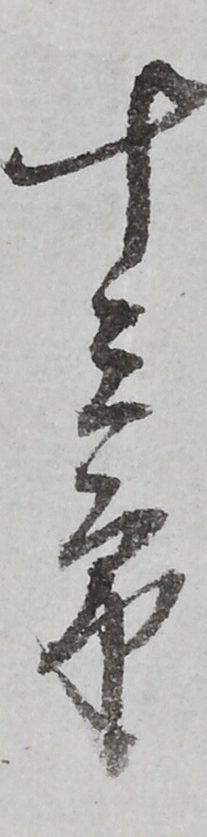十三郎
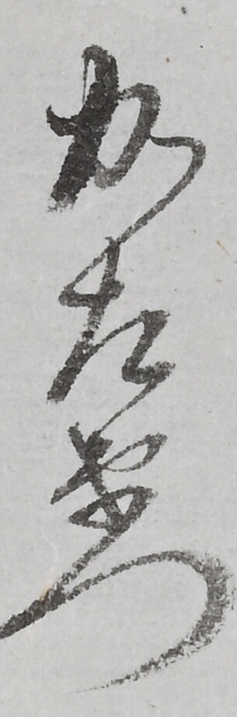伊左衛門
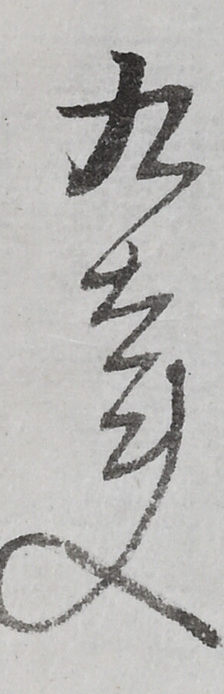九太夫
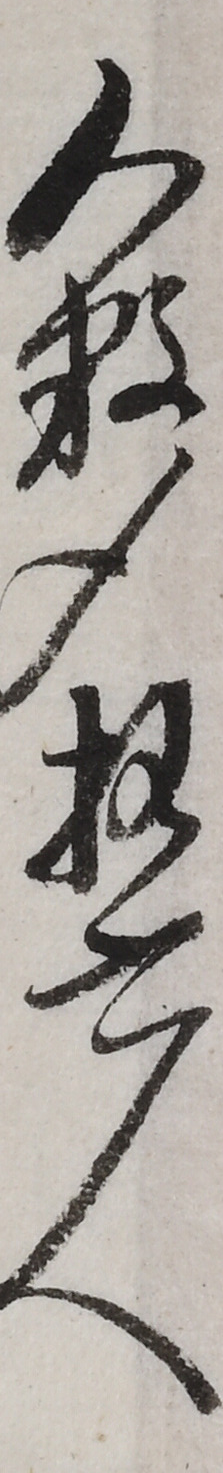人数〆拾六人
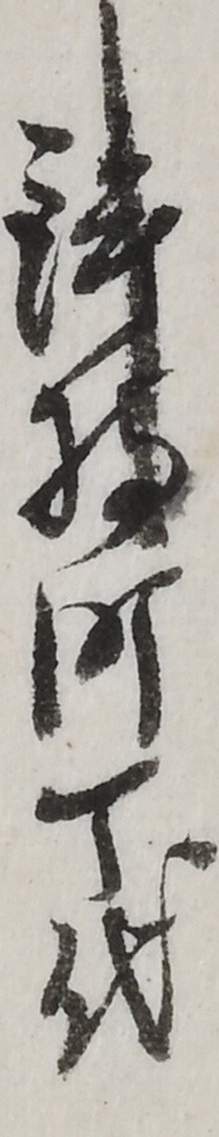鉾持町丁代
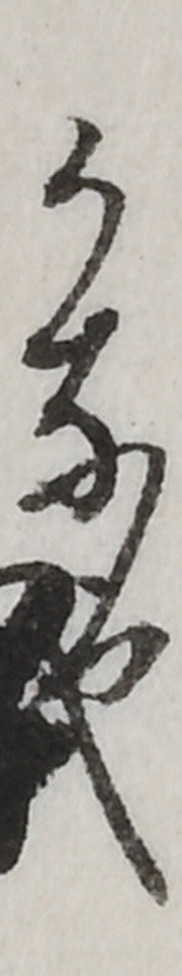かなや
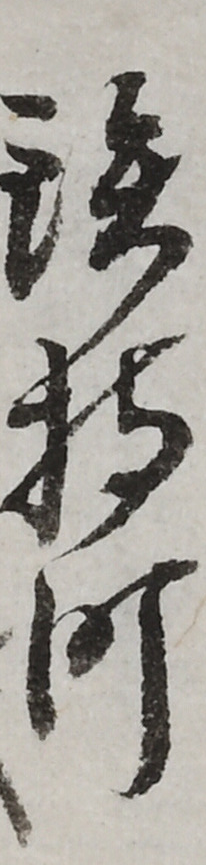鉾持町
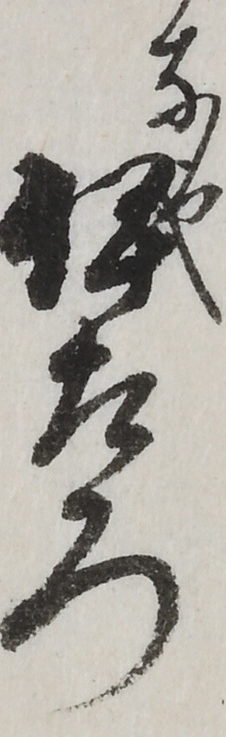伊左衛門
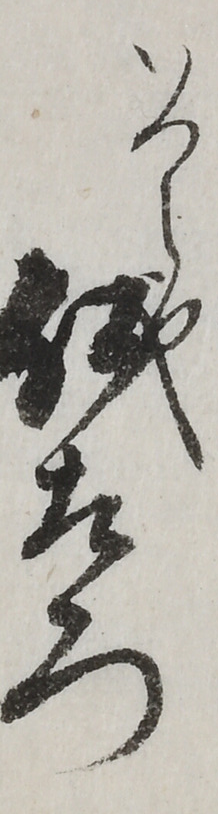伊左衛門
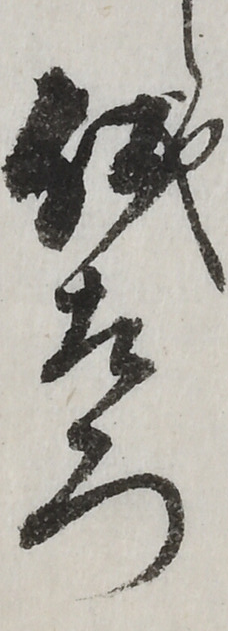伊左衛門

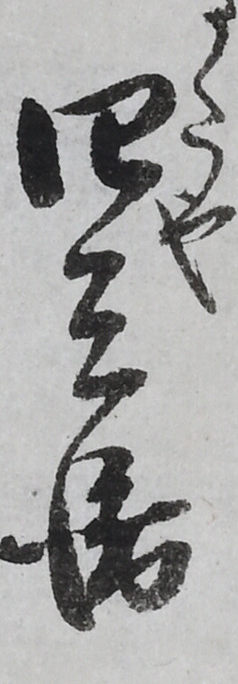四兵衛
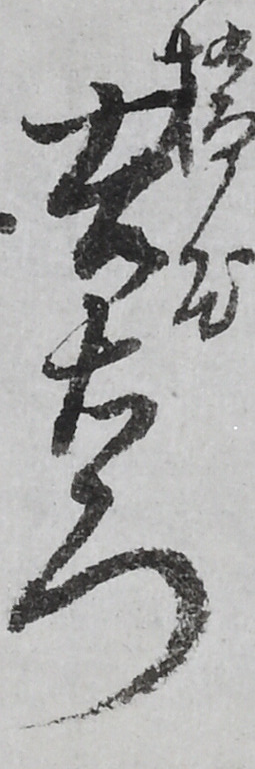吉右衛門
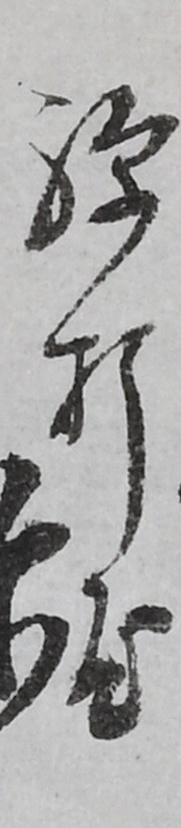綿打屋
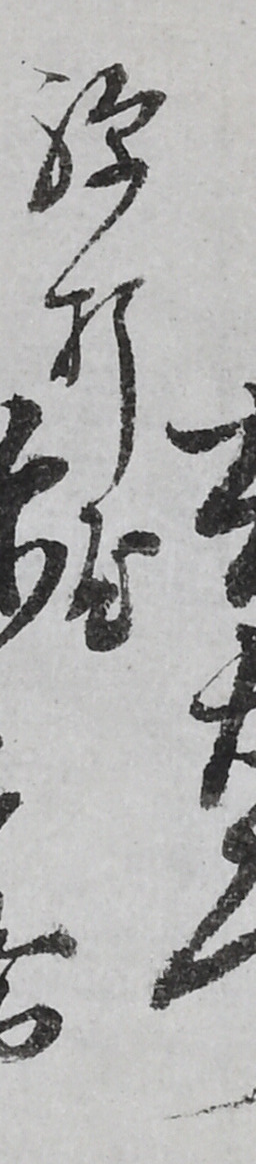綿打屋
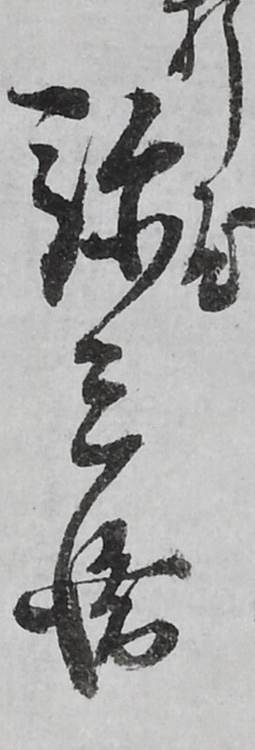弥兵衛
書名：當町火消道具幷役附帳
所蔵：伊那市立高遠町図書館・合同会社AMANE
